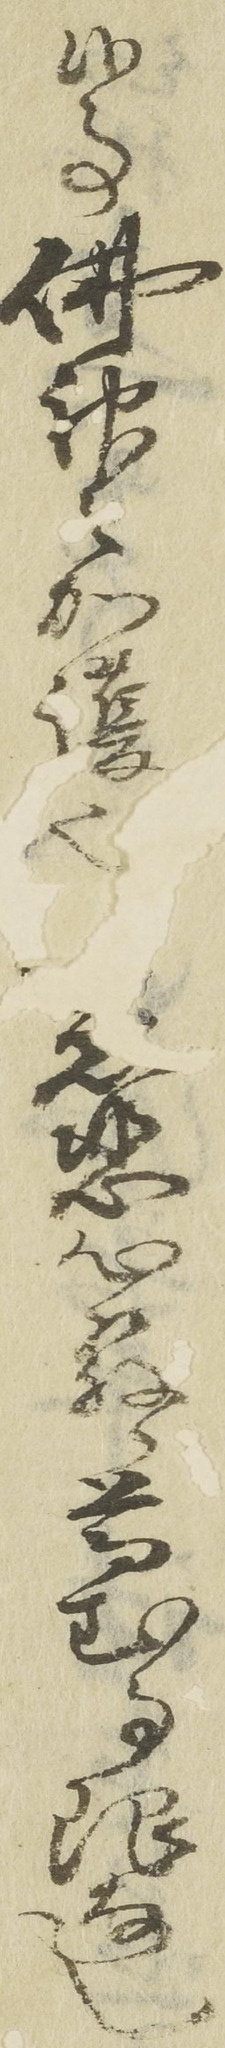候事佛神之加護也慈悲心蒙り尊むる限なし
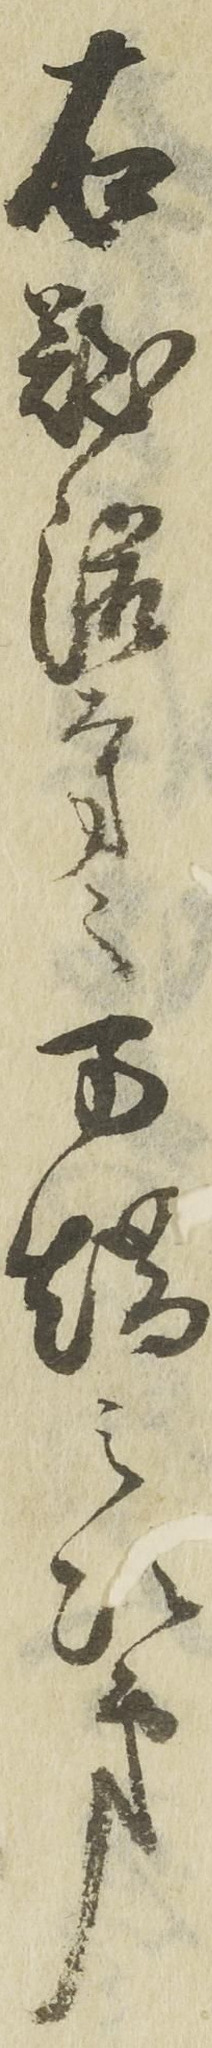右難渋旁々万端之次第
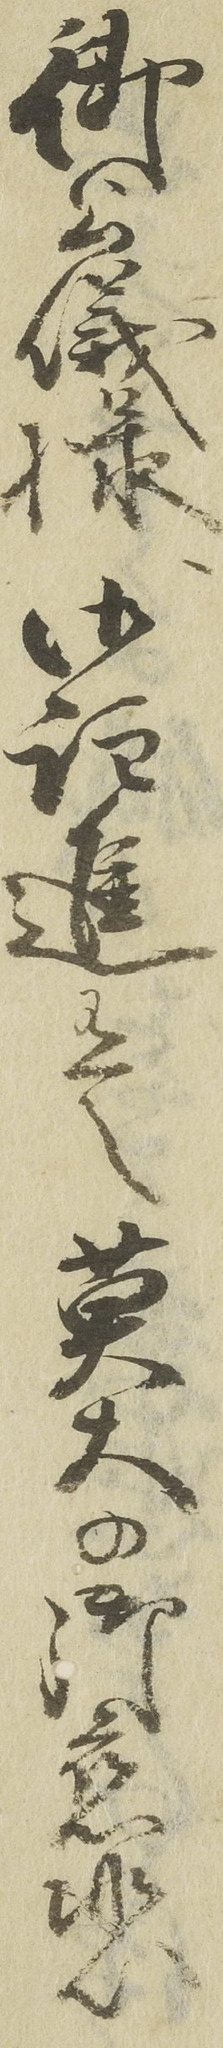御公儀様へ御注進有之莫大の御慈悲
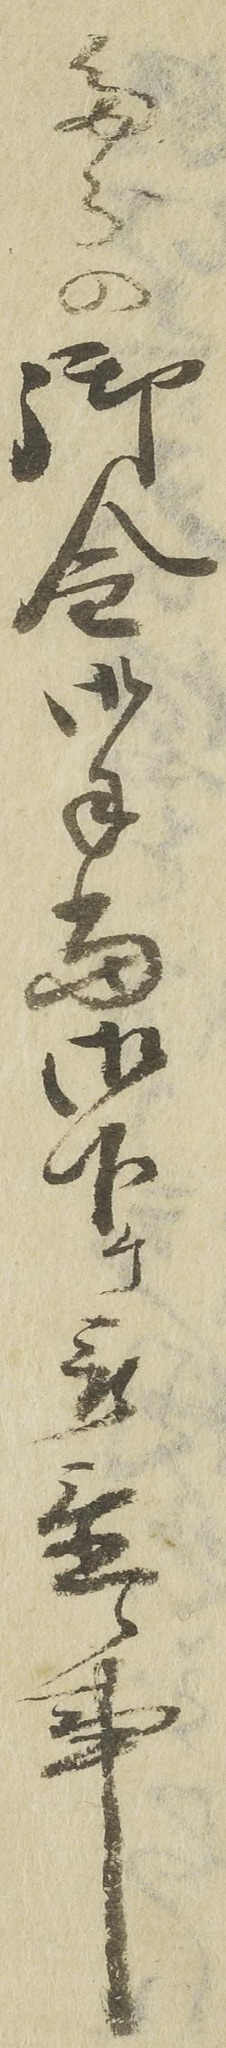多分の御金御手当御下ヶ被置候事
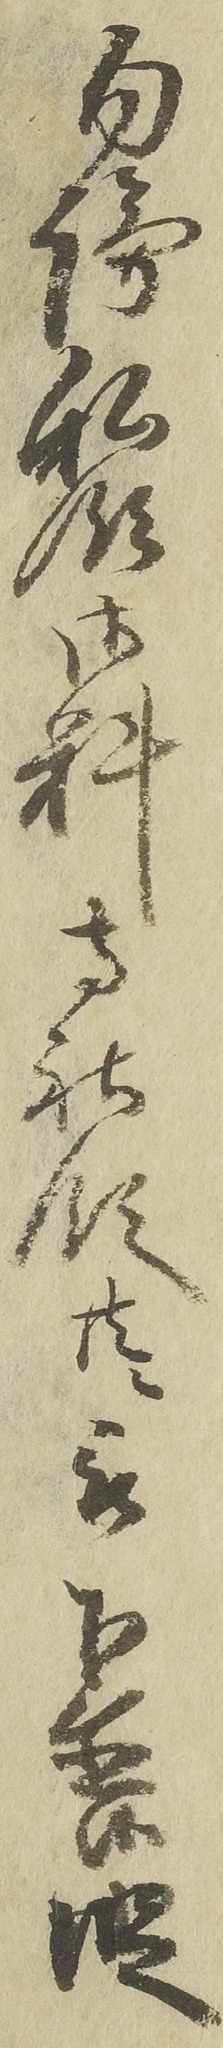勿論私領御料寺社領共ニ被下置候段

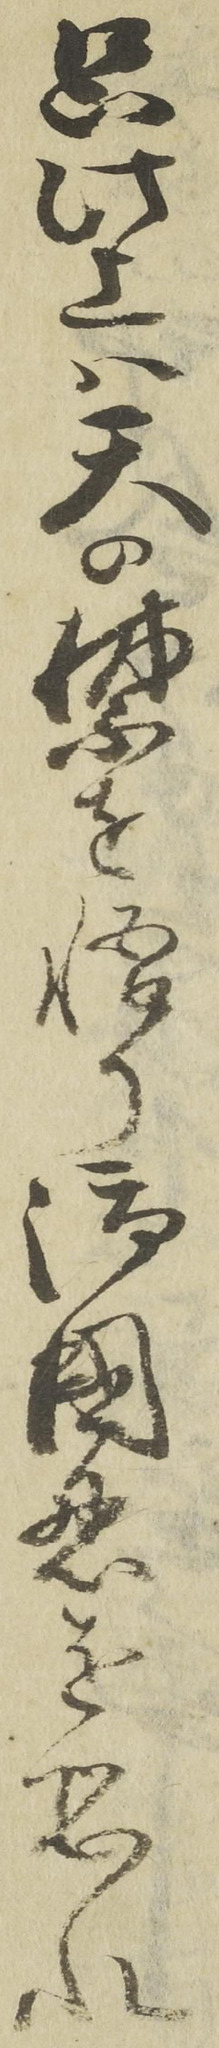只此上ハ天の禁を悟り御国恩を恐れ
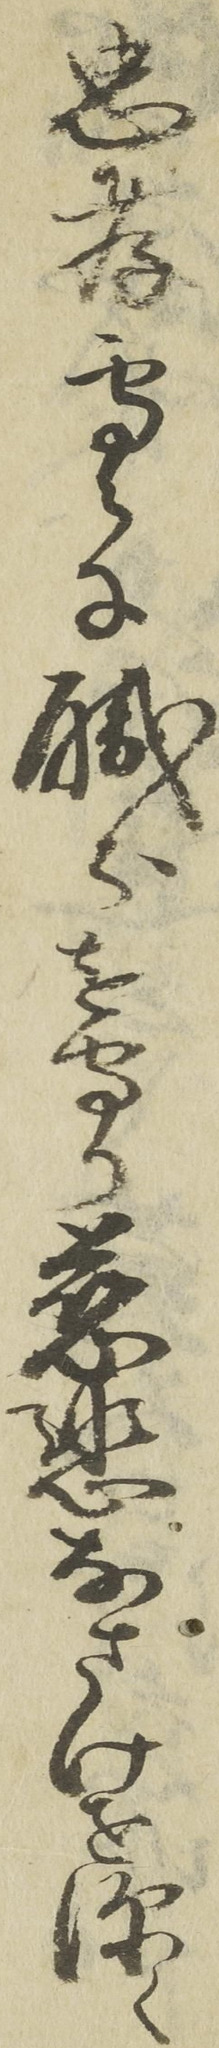忠孝専らに職分を守り慈悲なさけを深く
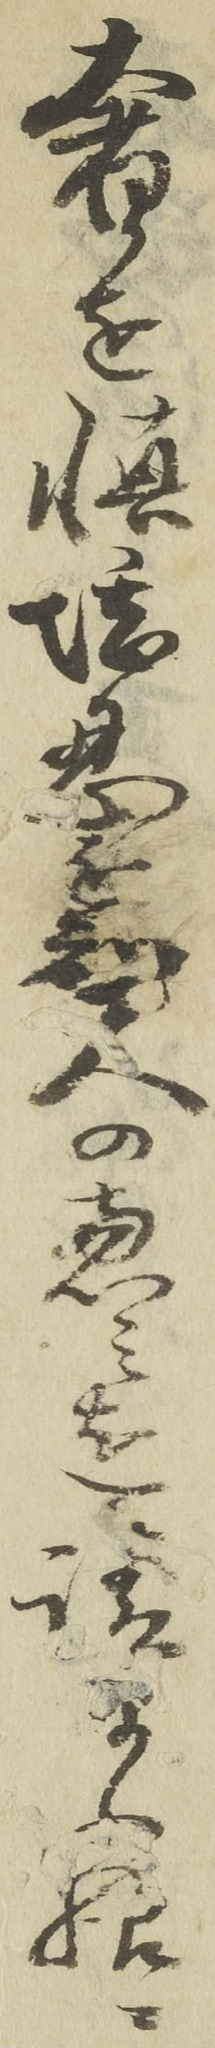奢りを慎堪忍を知人の恵ミを請給ふ様ニ
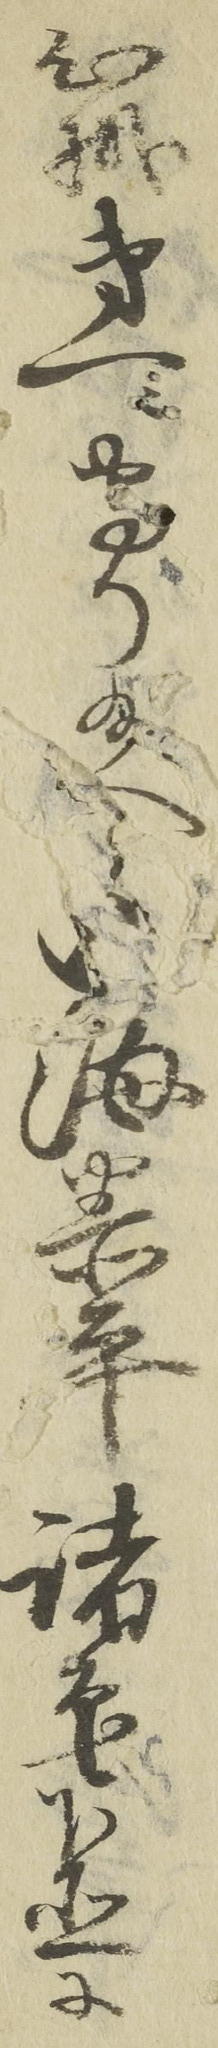心掛第一ニ守り給へは四海泰平諸色下直に
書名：弘化四　大地震由来　全
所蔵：東京大学地震研究所図書室 Earthquake Research Institute Library, The University of Tokyo, JAPAN
